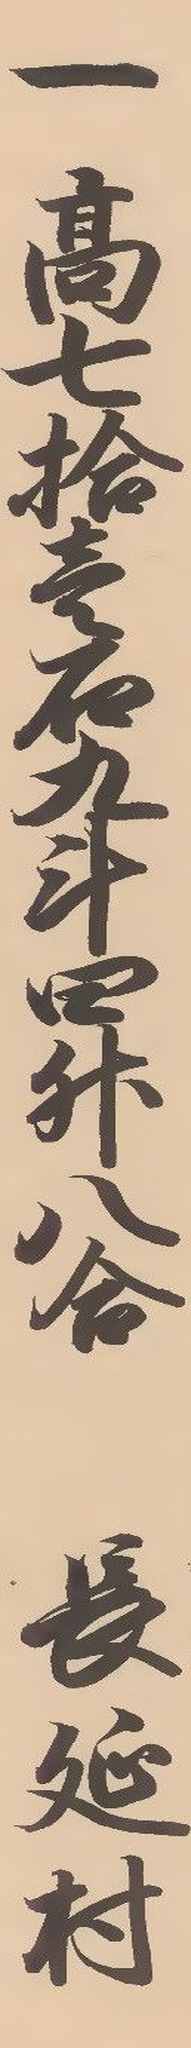一高七拾壱石九斗四升八合長延村
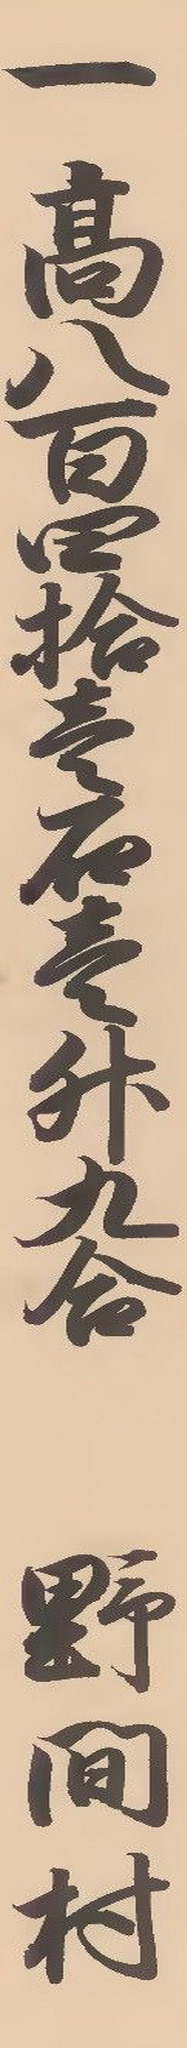一高八百四拾壱石壱升九合野間村
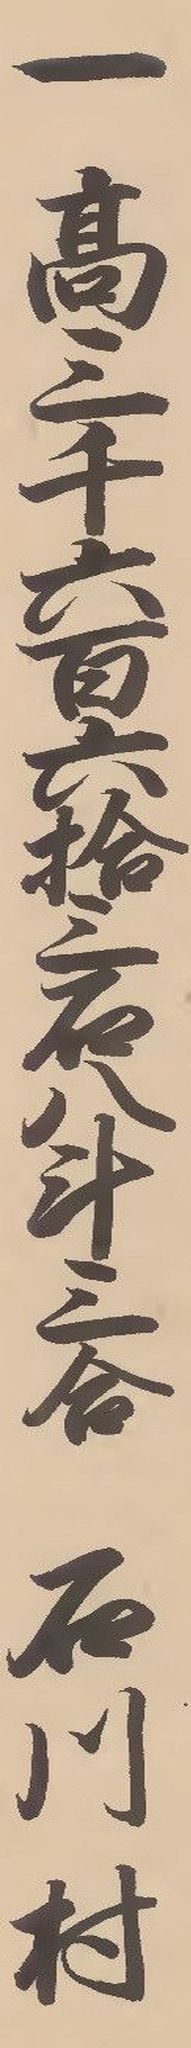一高三千六百六拾三石八斗三合石川村
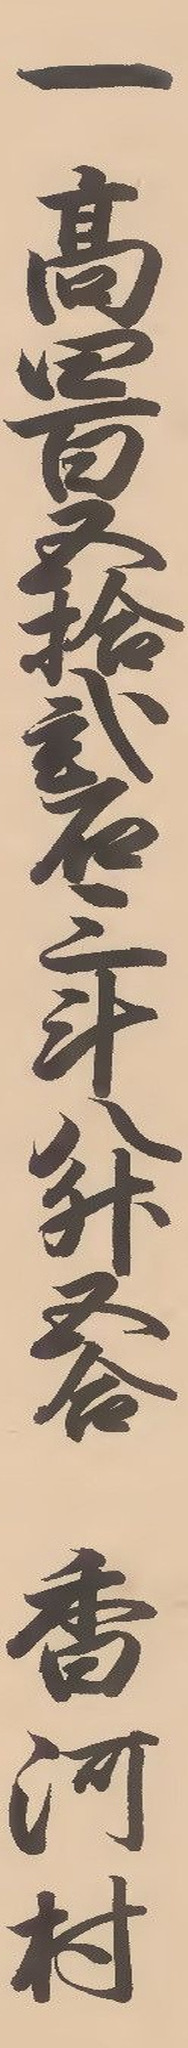一高四百五拾弐石三斗八升五合香河村
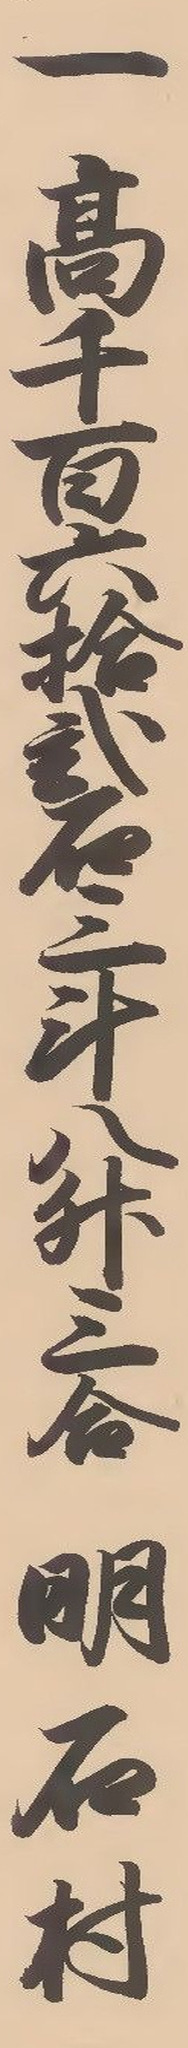一高千百六拾弐石三斗八升三合明石村
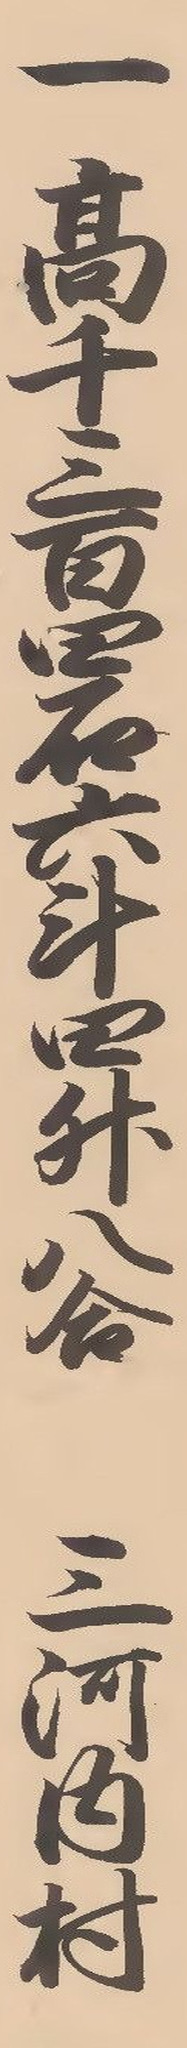一高千三百四石六斗四升八合三河内村

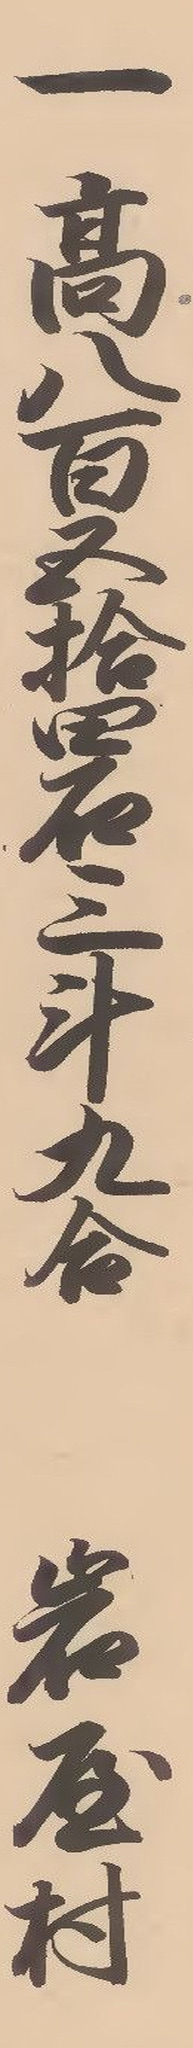一高八百五拾四石三斗九合岩屋村
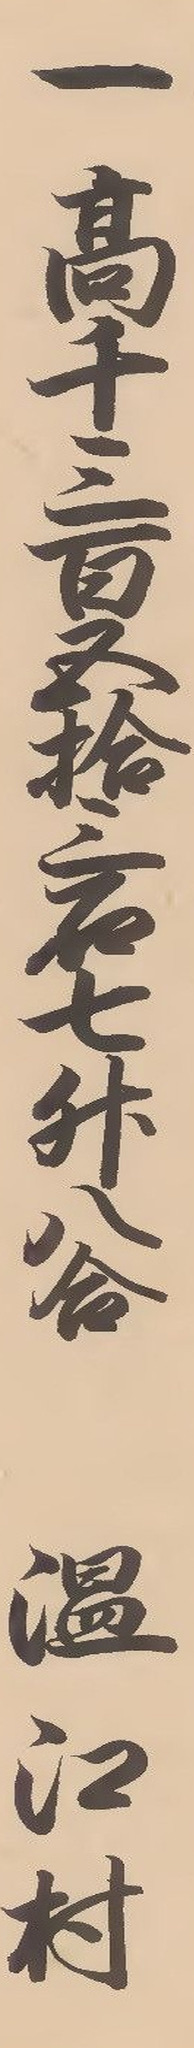一高千三百五拾三石七升八合温江村
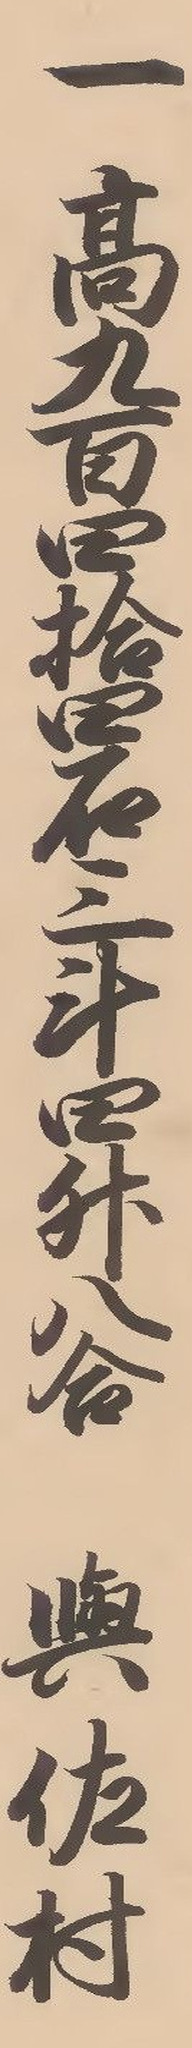一高九百四拾四石三斗四升八合与佐村
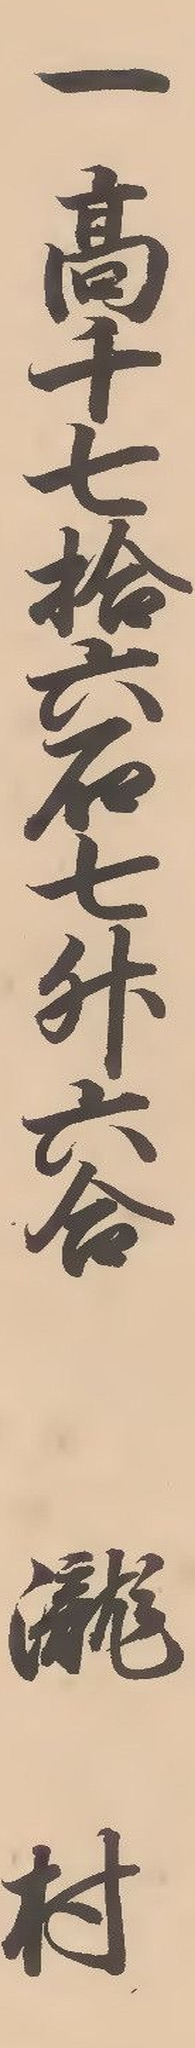一高千七拾六石七升六合滝村
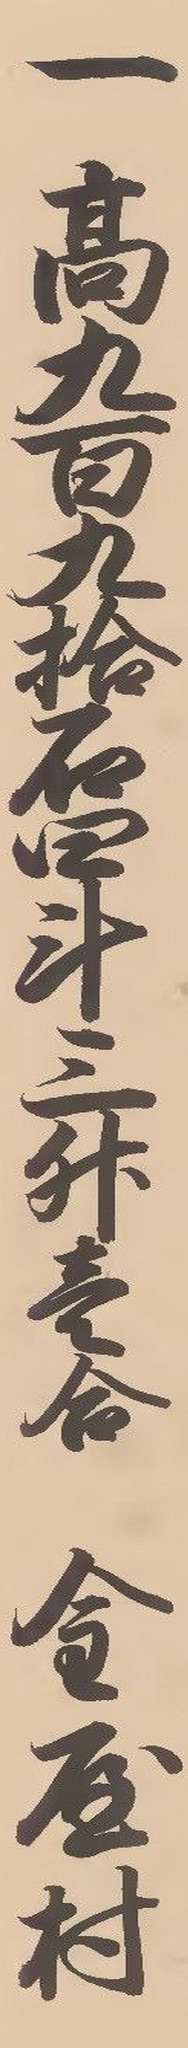一高九百九拾石四斗三升壱合金屋村
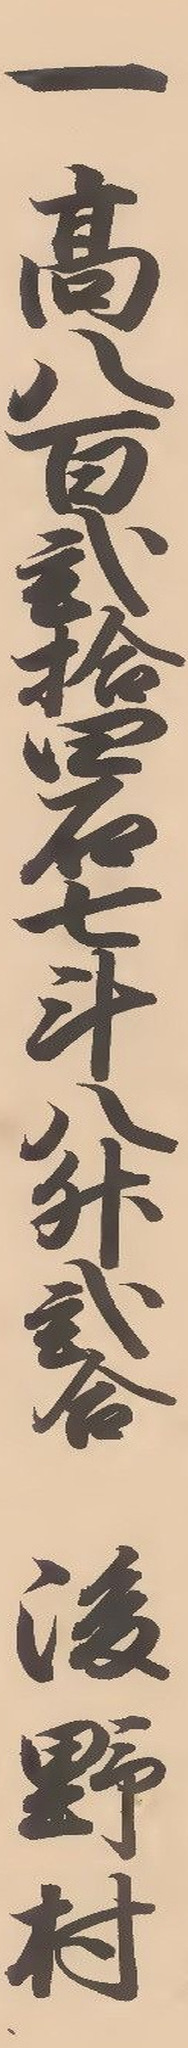一高八百弐拾四石七斗八升弐合後野村
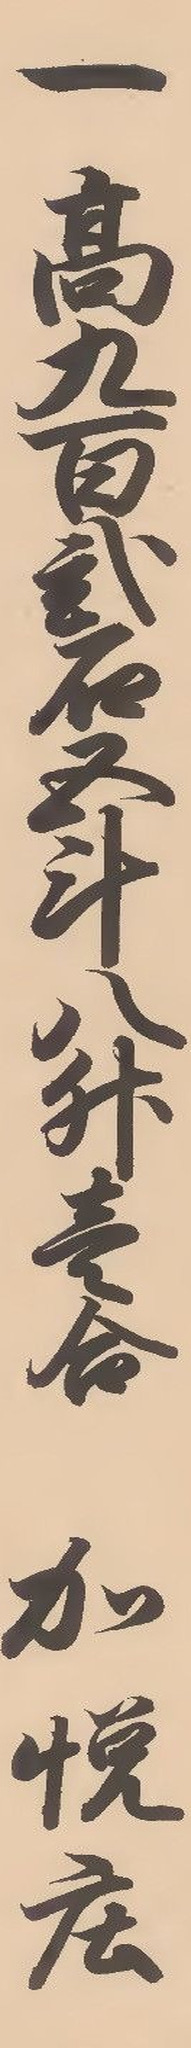一高九百弐石五斗八升壱合加悦庄
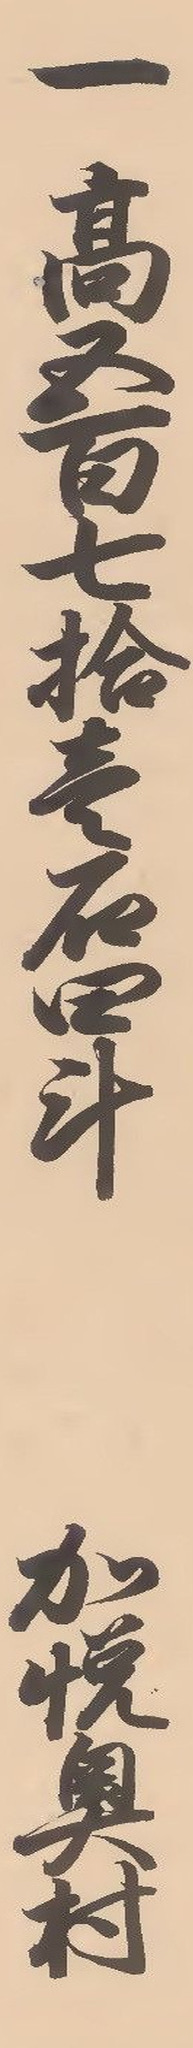一高五百七拾壱石四斗加悦奥村

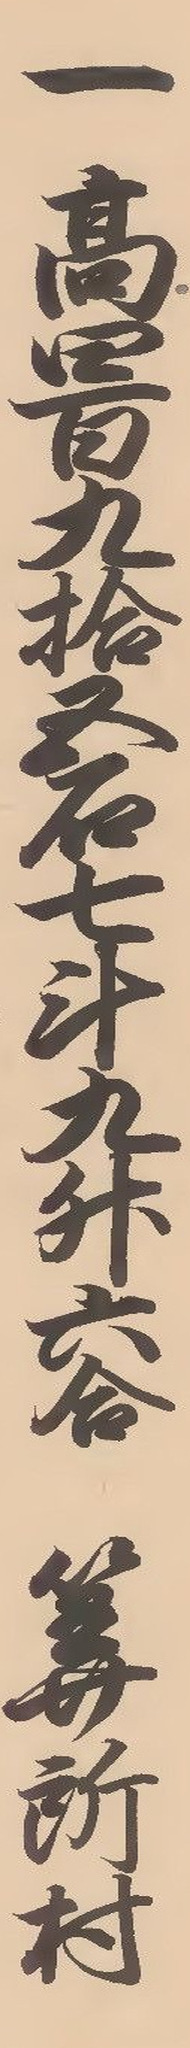一高四百九拾五石七斗九升六合算所村
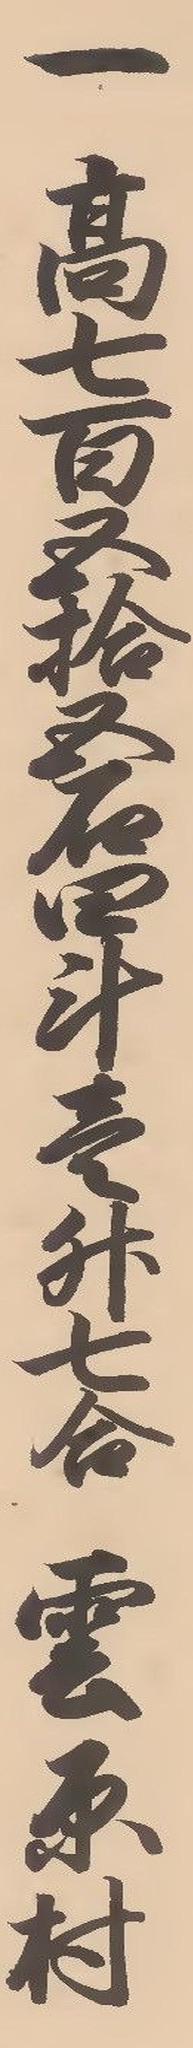一高七百五拾五石四斗壱升七合雲原村
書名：丹後国郷帳
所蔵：国立公文書館 National Archives of Japan
